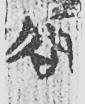卲
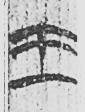王
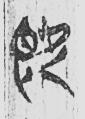既
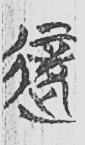復
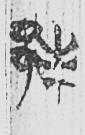邦
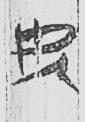𡚦
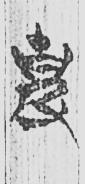尅
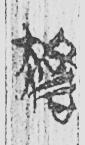{害夫}
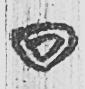回
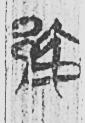○（蔡）
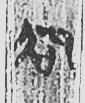卲
